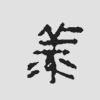備
